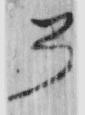乃
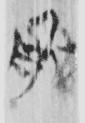服
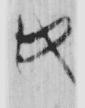女
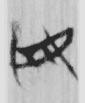母
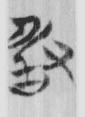敢
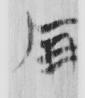朋
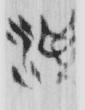{水兇}
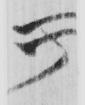于
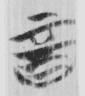酉
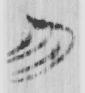勿
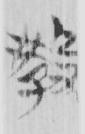教
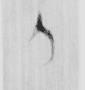人
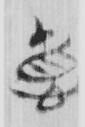惪
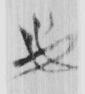我
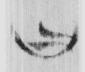曰
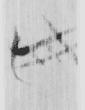母
